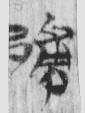郙
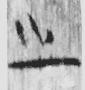之
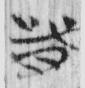歲（歲）
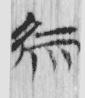𫵖
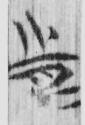之月
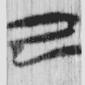己
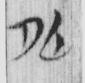卯
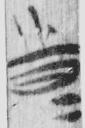之日
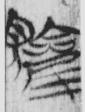觀
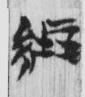綳
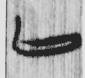㠯（以）
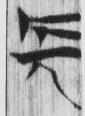長
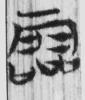霝（靈）
